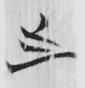之
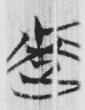麥
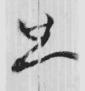也
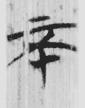不
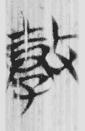{𣪊子}
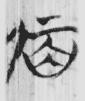{人𠀬}
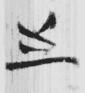之
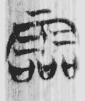霝
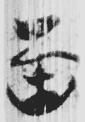{云山}
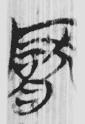厭
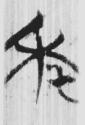年
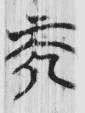而
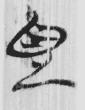見
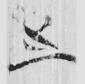之
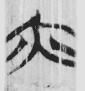亦
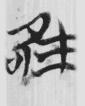唯
